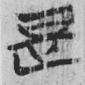是
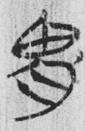胃（謂）
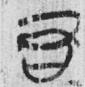君君
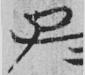子子
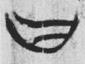曰
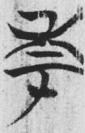考（孝）
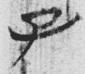子
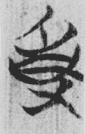事
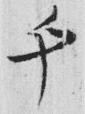父
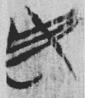母（母）
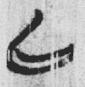㠯（以）
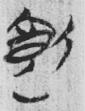飤（食）
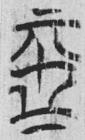亞（惡）
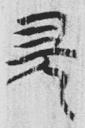𡵂（美）
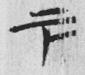下
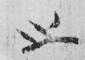之
